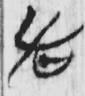左
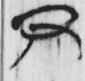尹
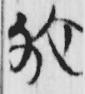{力它}
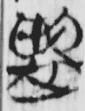○（舉）
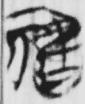禱
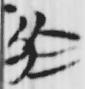於
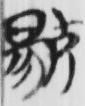殤
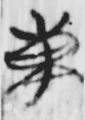東
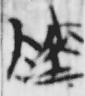陵
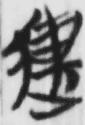連
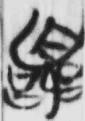囂
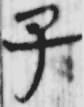子
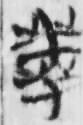○（發）
